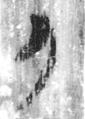人
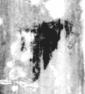丁
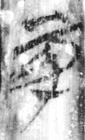亥
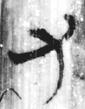又（有）
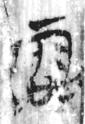霝（靈）
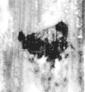丁
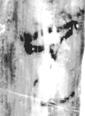巳
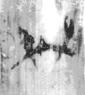夂（終）
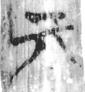亓（其）
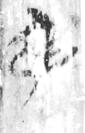身
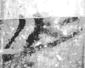亡
